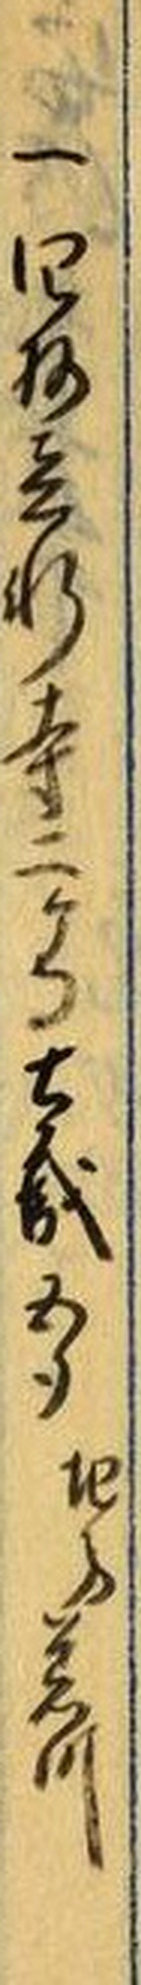一四拾壱軒寺二ヶ寺土蔵五ッ地方荒町
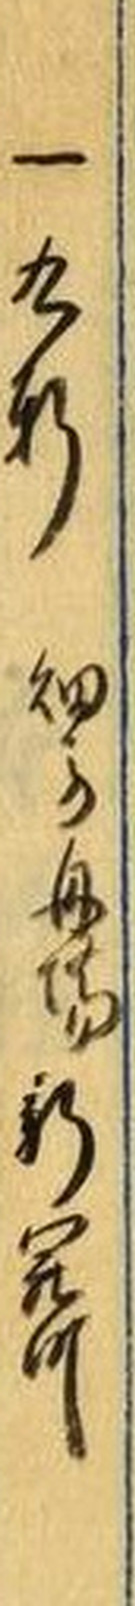一九軒畑方船場新開町
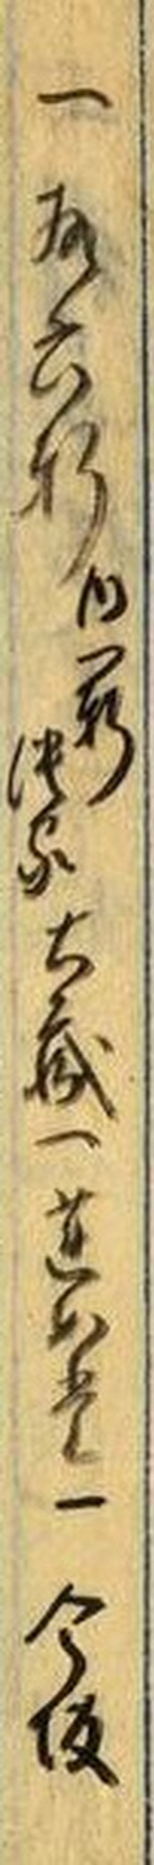一拾六軒内一軒潰家土蔵一蓮如堂一今坂
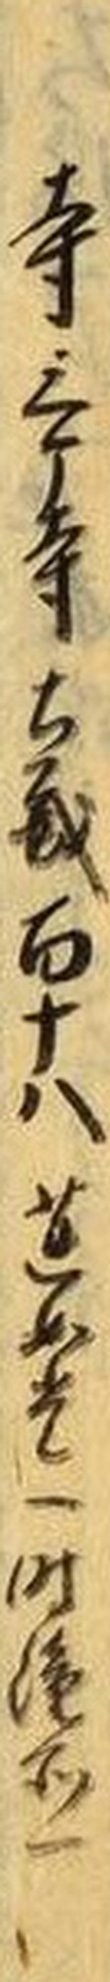寺三ヶ寺土蔵百十八蓮如堂一時鐘所一
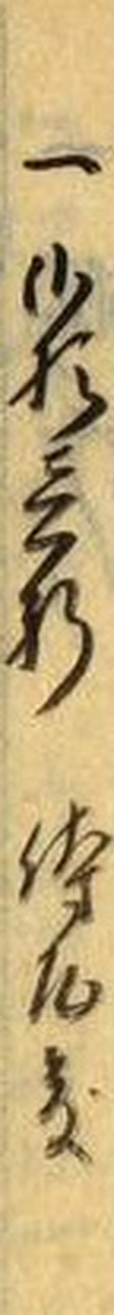一弐拾三軒侍屋敷

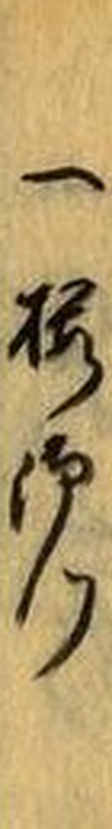一桜御門
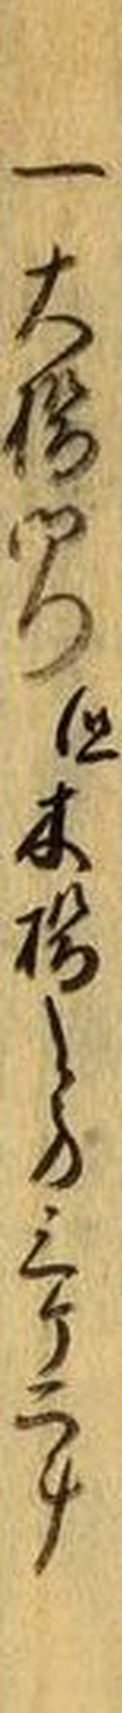一大橋御門但木橋之方三ヶ二計
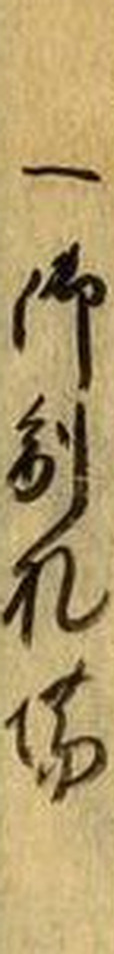一御制札場
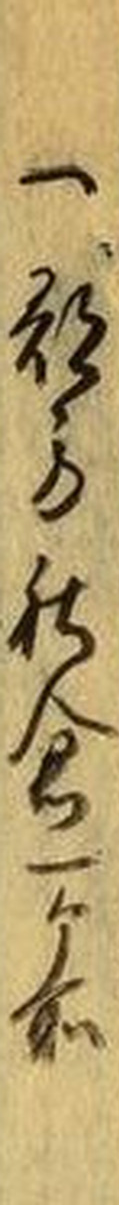一郡方社倉一ヶ所
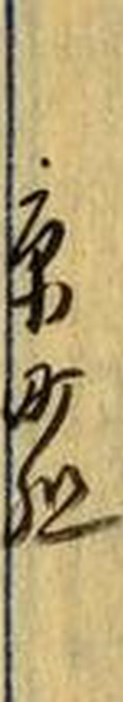本町組
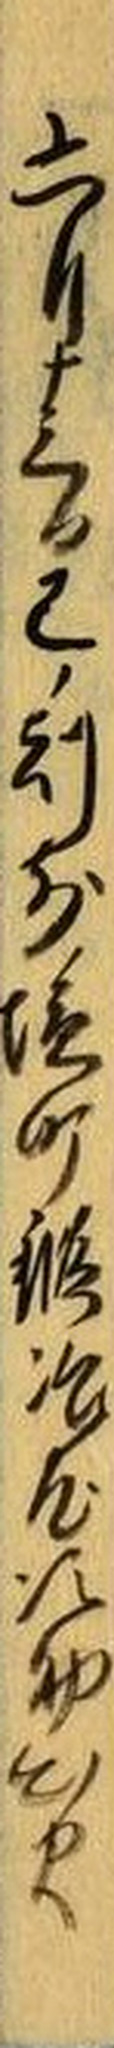六月十三日巳ノ刻前塩町鍛冶屋次助出火
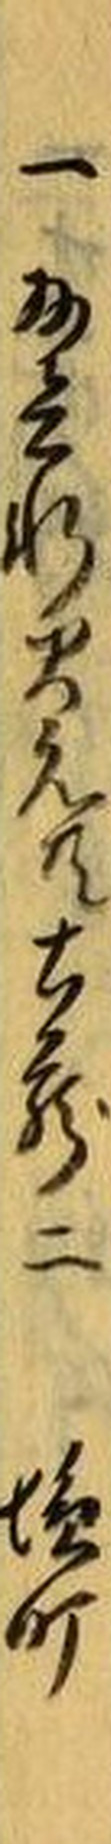一拾壱軒火元共土蔵二塩町
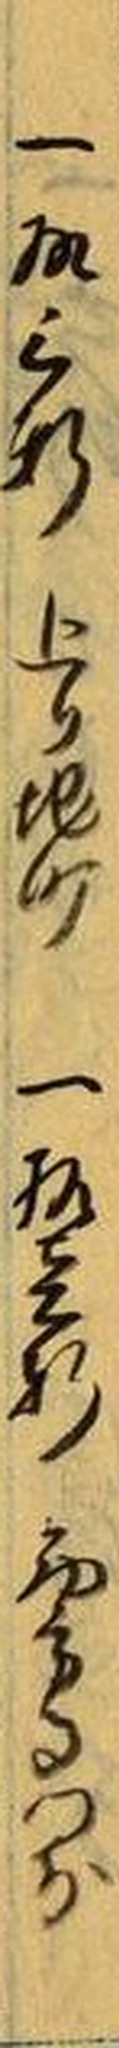一拾三軒上り地町一拾壱軒西方寺門前
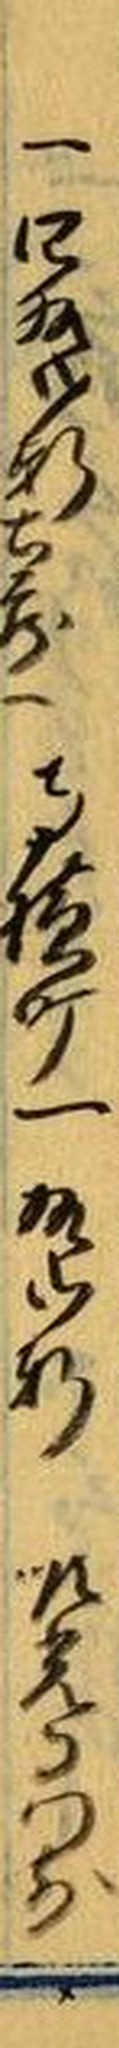一四拾弐軒土蔵一寺横町一拾弐軒順光寺門前
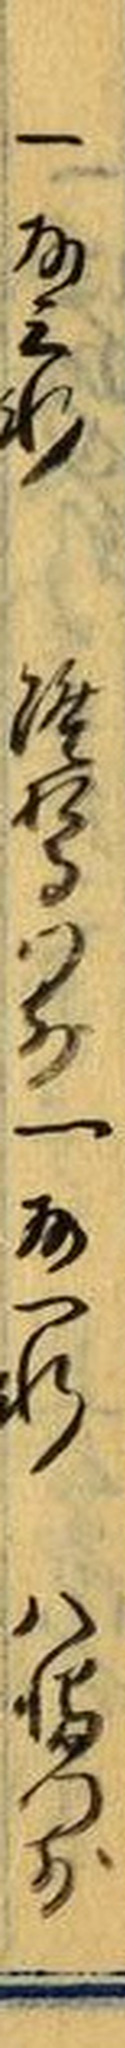一拾三軒隆松寺門前一拾一軒八幡門前
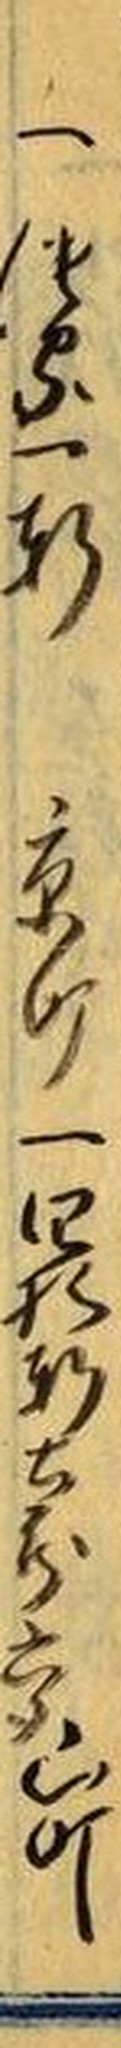一潰家一軒京町一四拾軒土蔵六ッ山町
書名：温古集 五巻
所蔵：福井県文書館 Fukui Prefectural Archives
